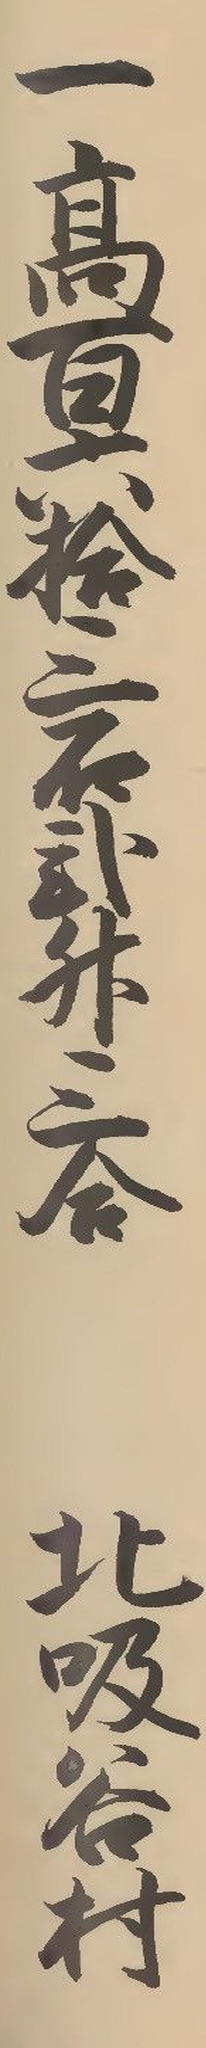一髙百六拾三石弐升三合北吸谷村
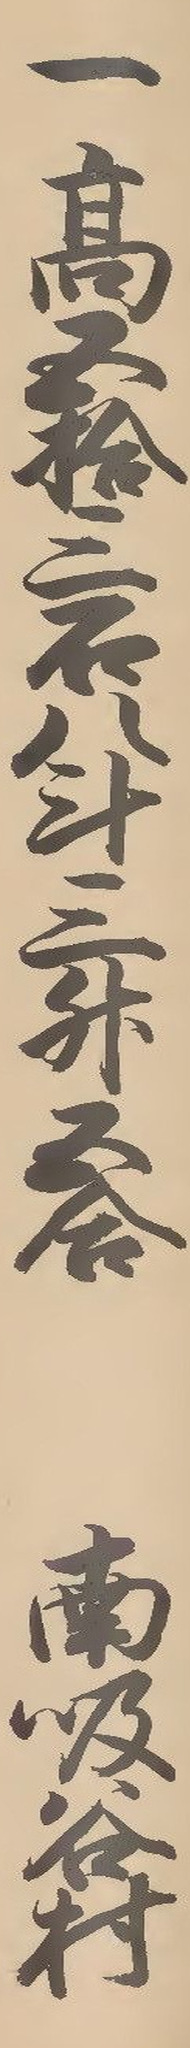一髙五拾三石八斗三升五合南吸谷村
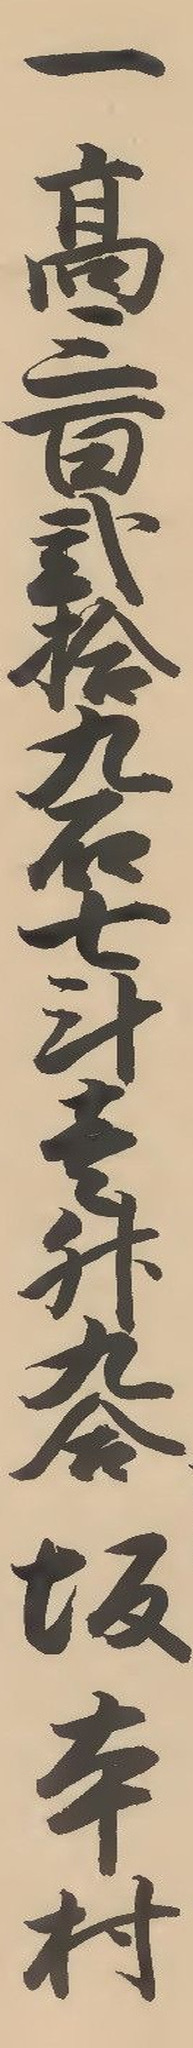一髙三百弐拾九石七斗壱升九合坂本村
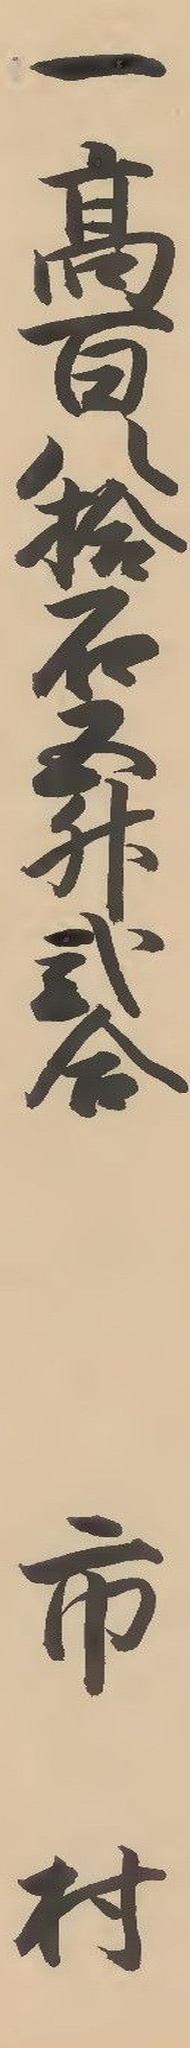一髙百八拾石五升弐合市村
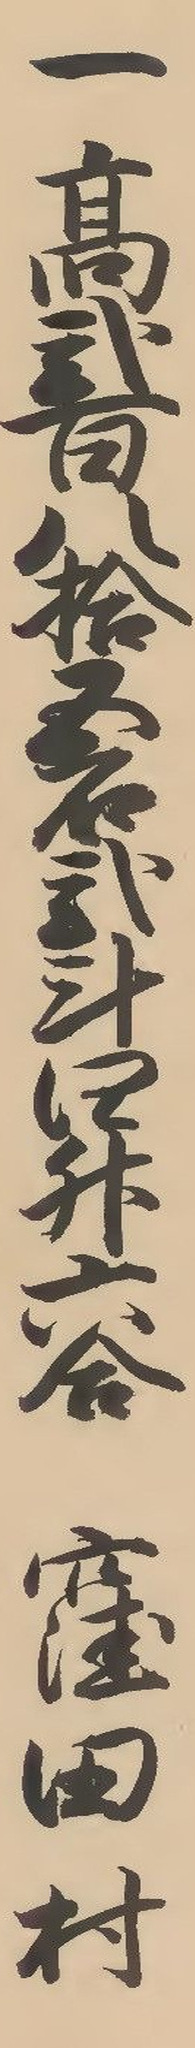一髙弐百八拾五石弐斗四升六合窪田村

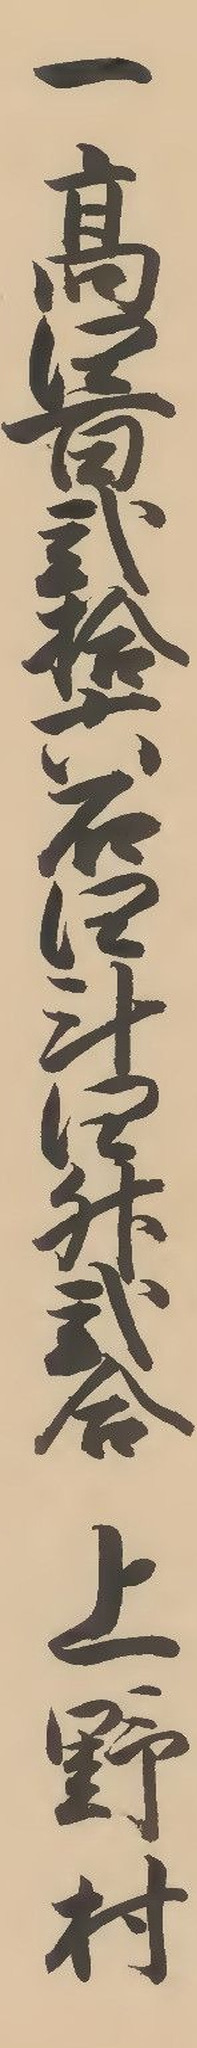一髙四百弐拾六石四斗四升弐合上野村
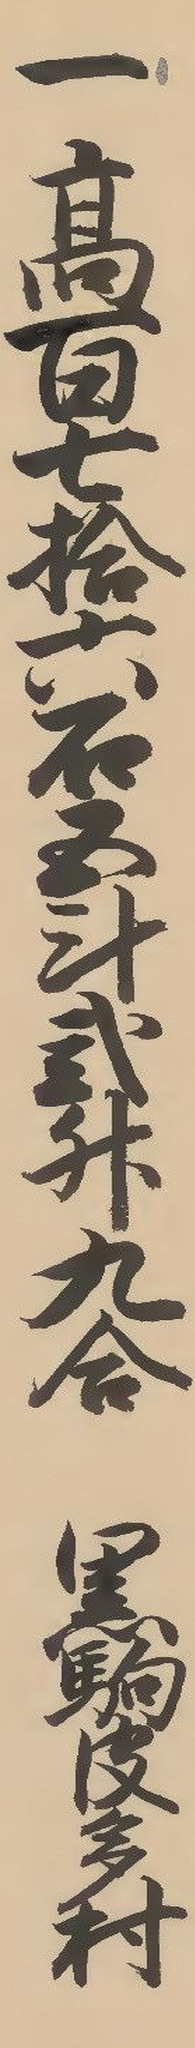一髙百七拾六石五斗弐升九合黑駒皮多村
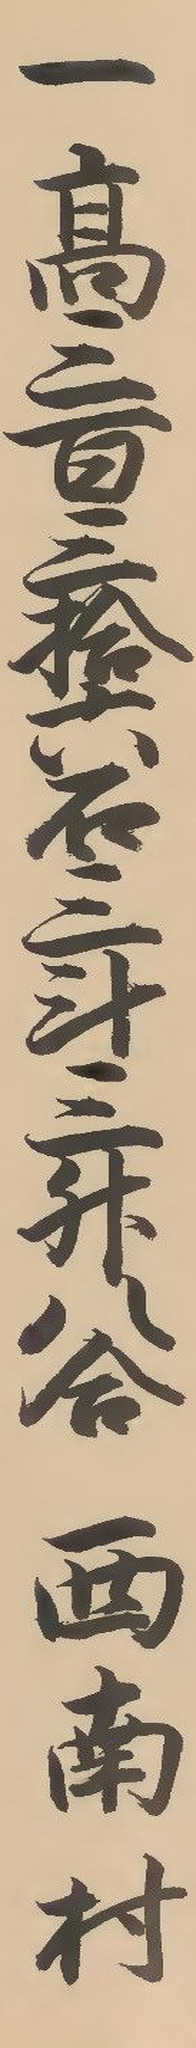一髙三百三拾六石三斗三升八合西南村
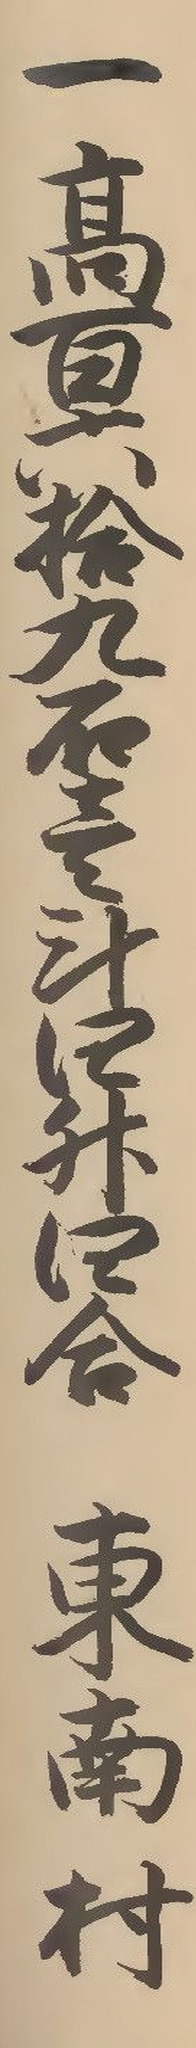一髙百六拾九石壱斗四升四合東南村
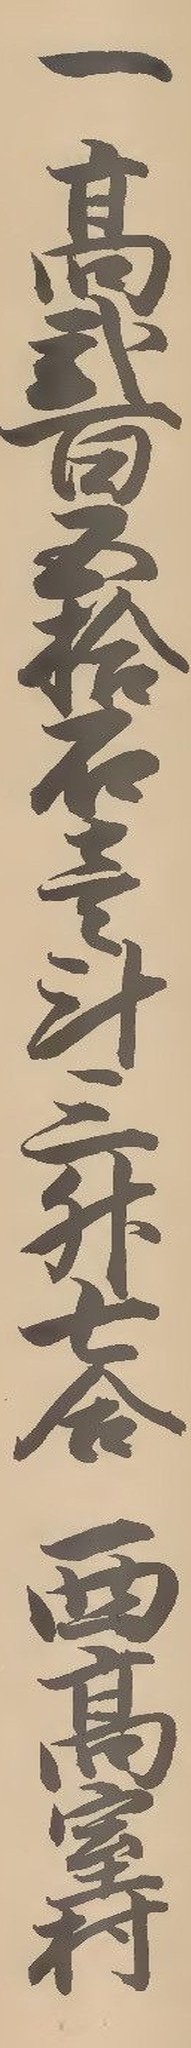一髙弐百五拾石壱斗三升七合西髙室村
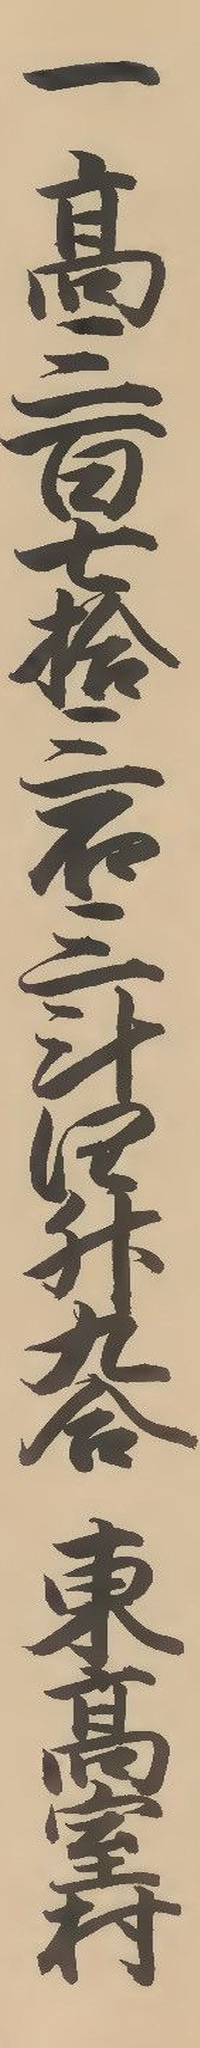一髙三百七拾三石三斗四升九合東髙室村
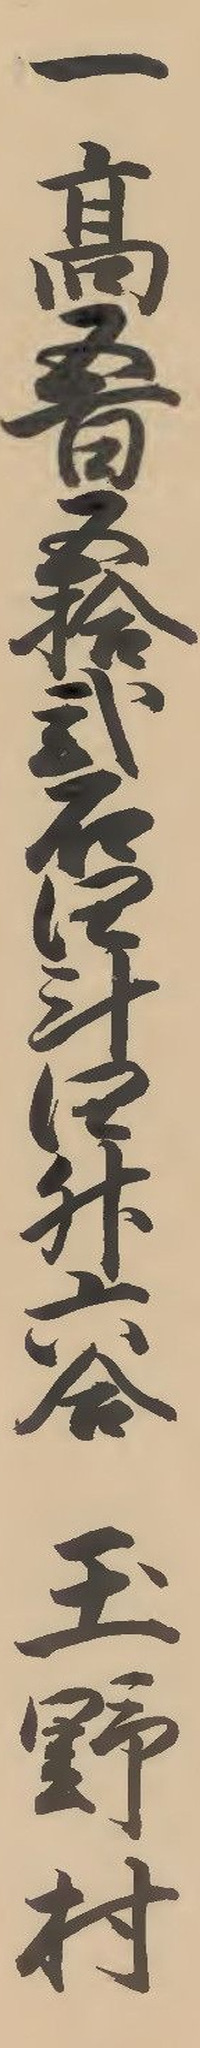一髙五百五拾弐石四斗四升六合玉野村
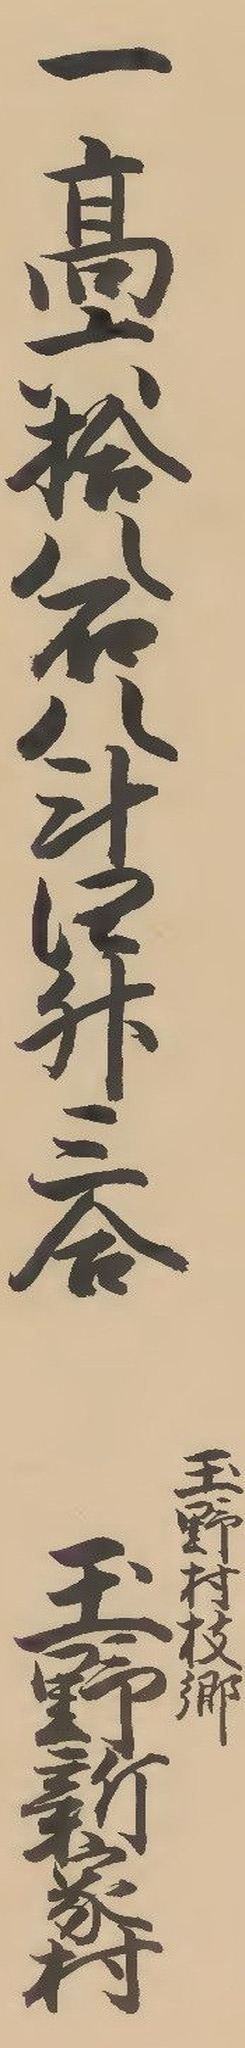一髙六拾八石八斗四升三合玉野新家村

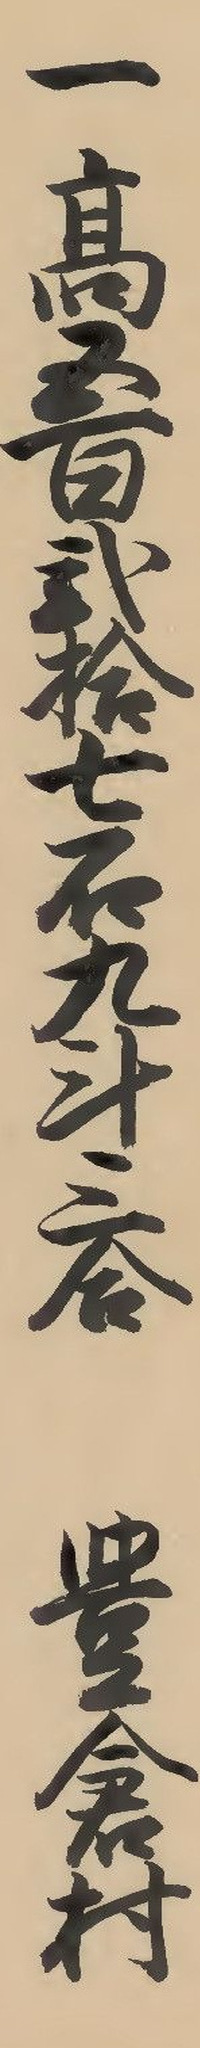一髙五百弐拾七石九升三合豊倉村
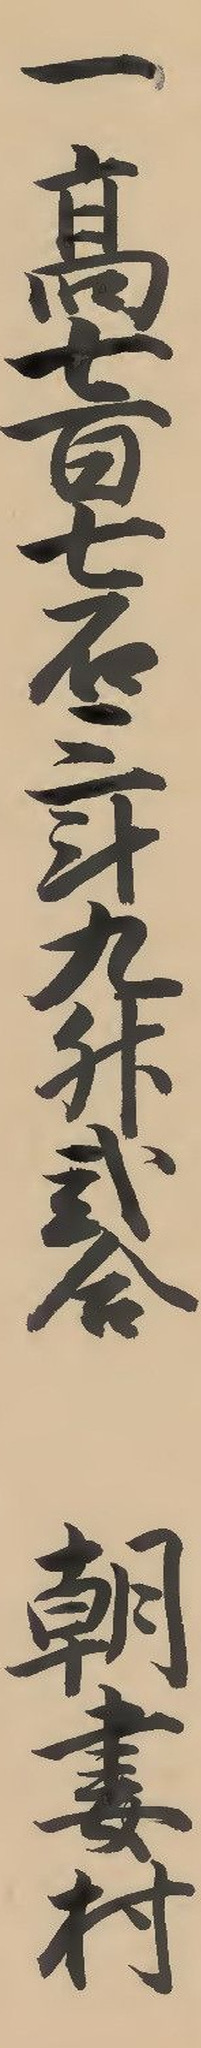一髙七百七石三斗九升弐合朝妻村
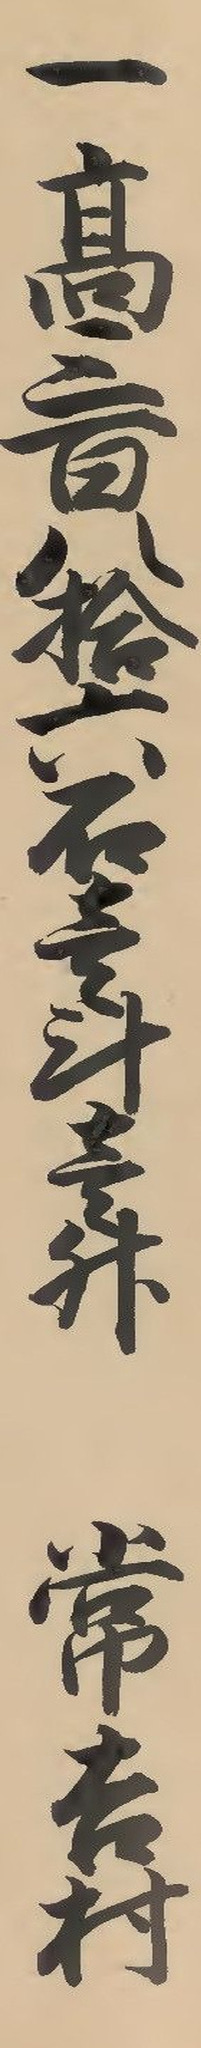一髙三百八拾六石壱斗壱升常吉村
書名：播磨国郷帳
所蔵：国立公文書館 National Archives of Japan
